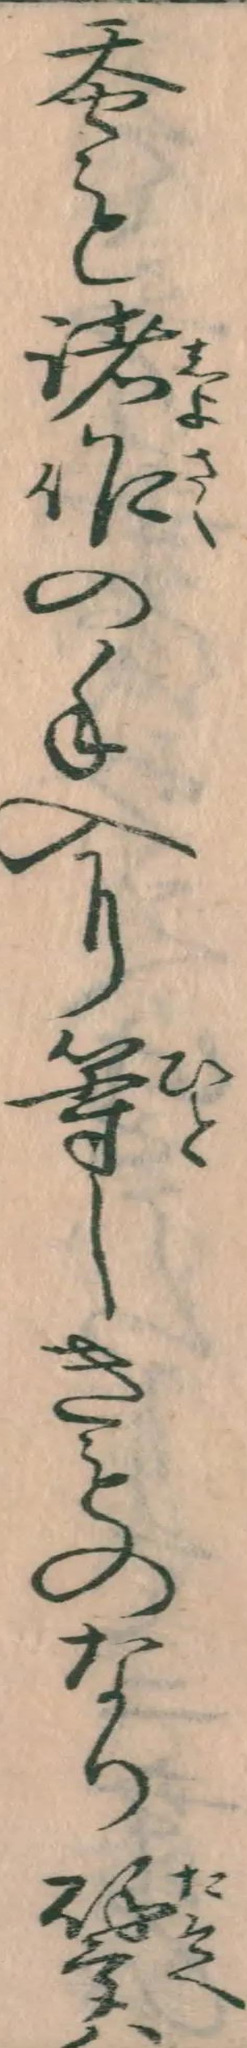蚕も諸作の手入に等しきものなり譬は
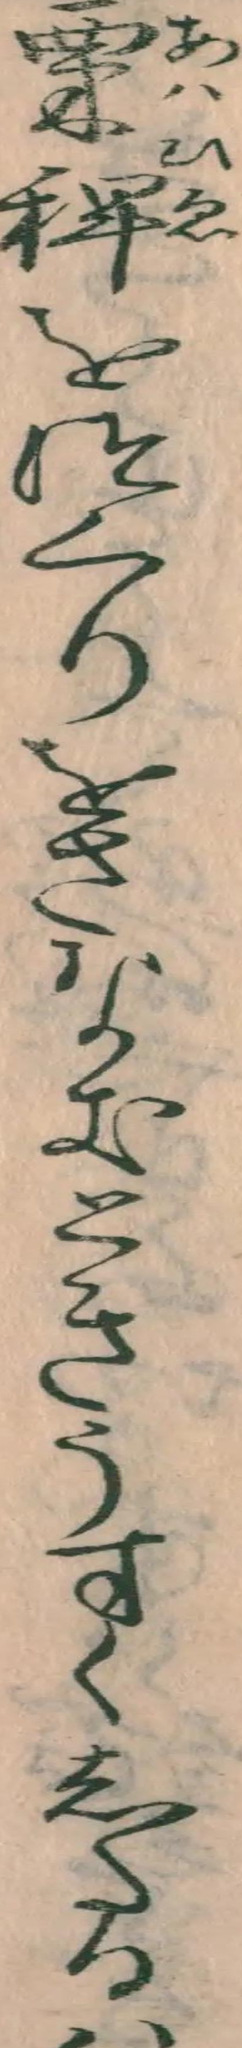粟稗をつくりをさなきときうすくしたるは
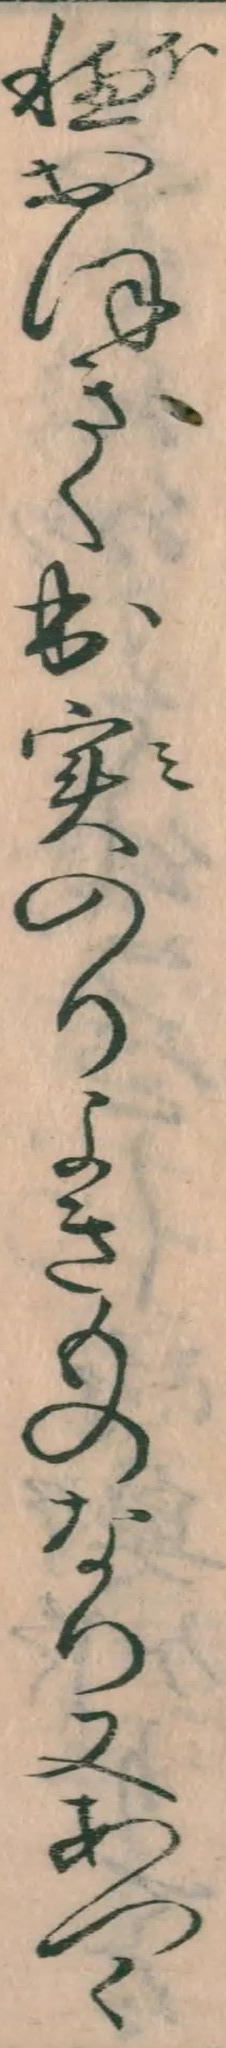穂おほきく出実のりよきものなり又あつく
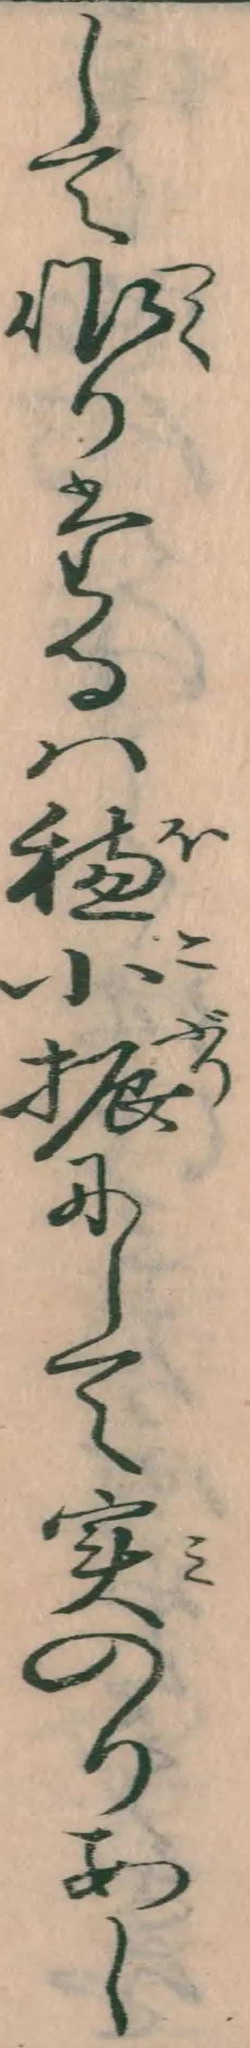して作りたるは穂小振にして実のりあし
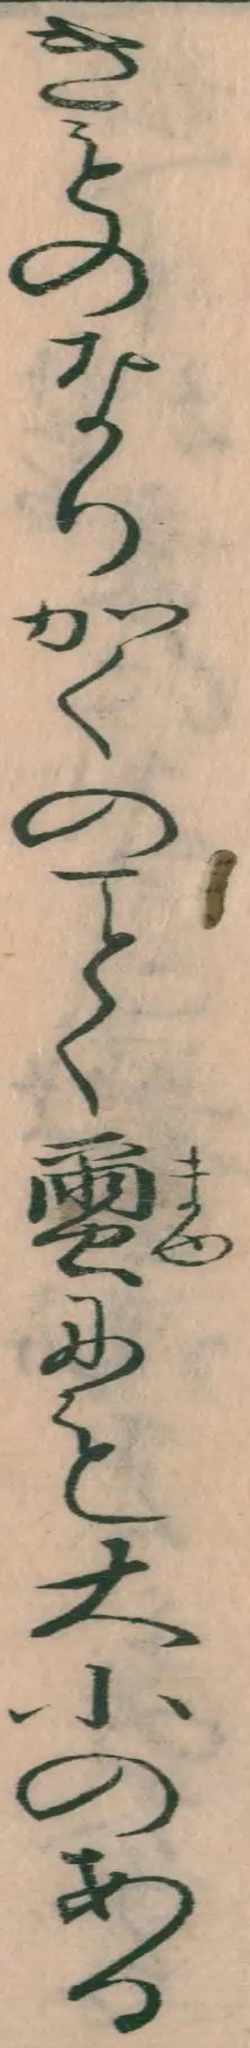きものなりかくのことく繭にも大小のある
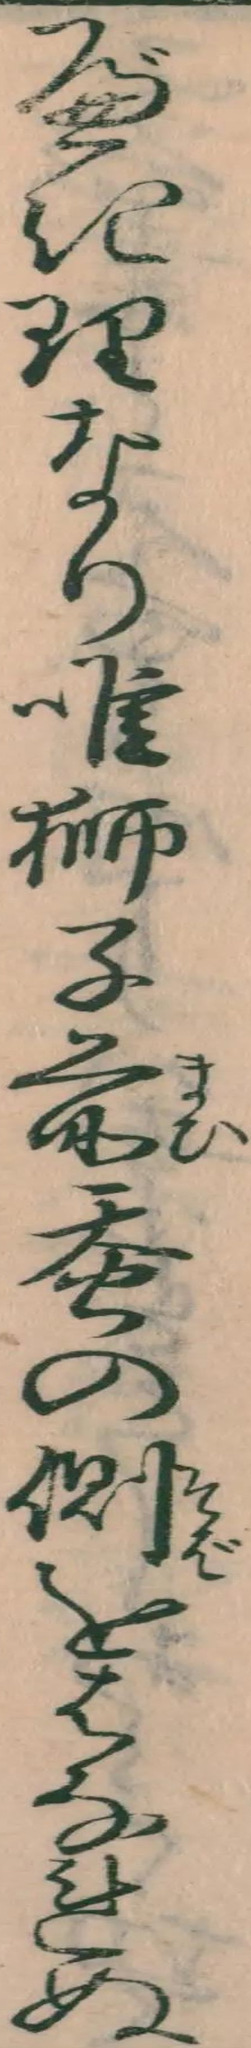べき理なり唯獅子前蚕の側をはなれぬ
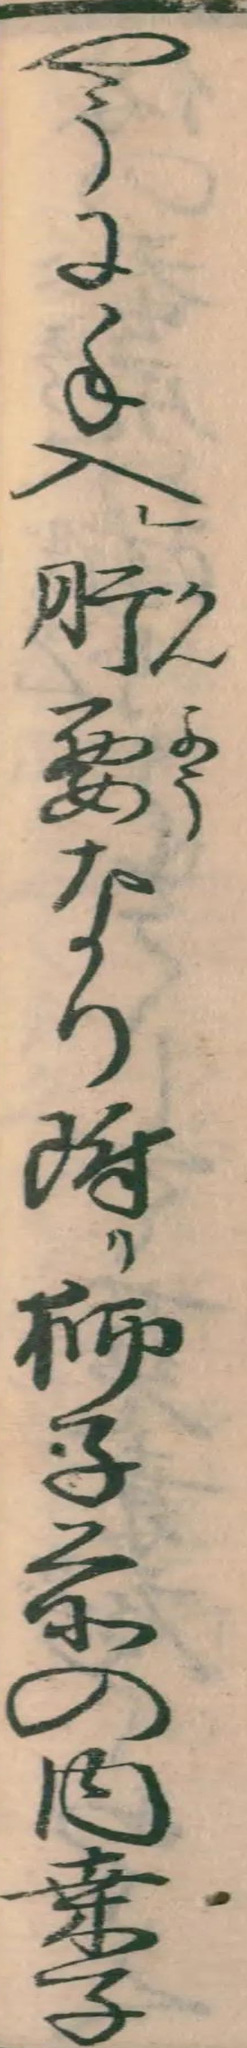やうに手入れ肝要なり附り獅子前の内桑子
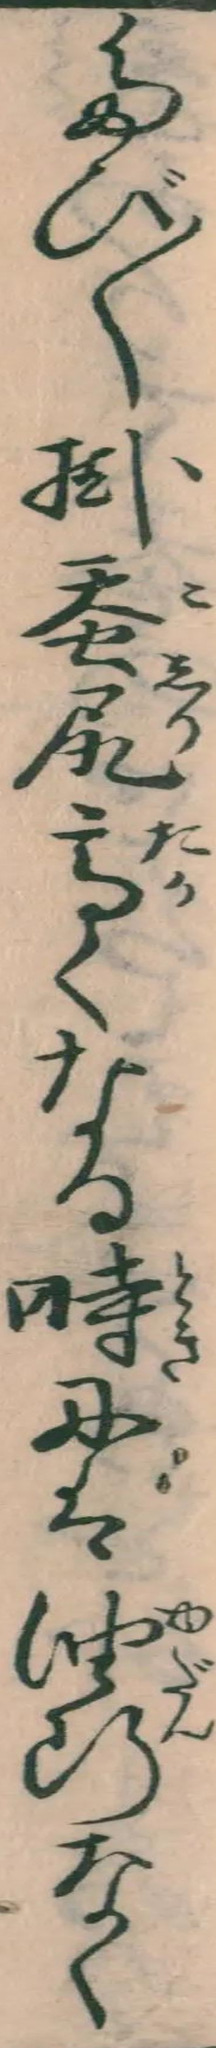たび〳〵掛蚕尻高くなる時には油断なく
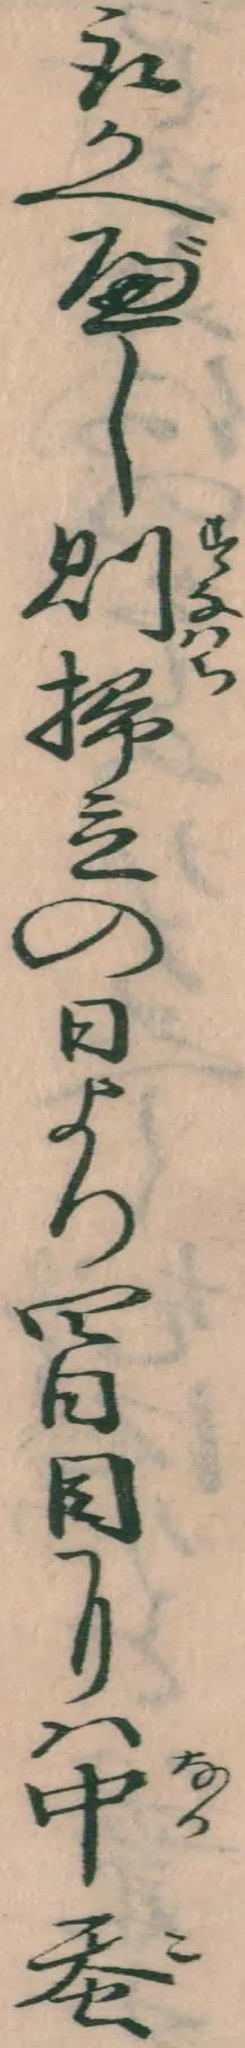取かへべし則掃立の日より四日目には中蚕
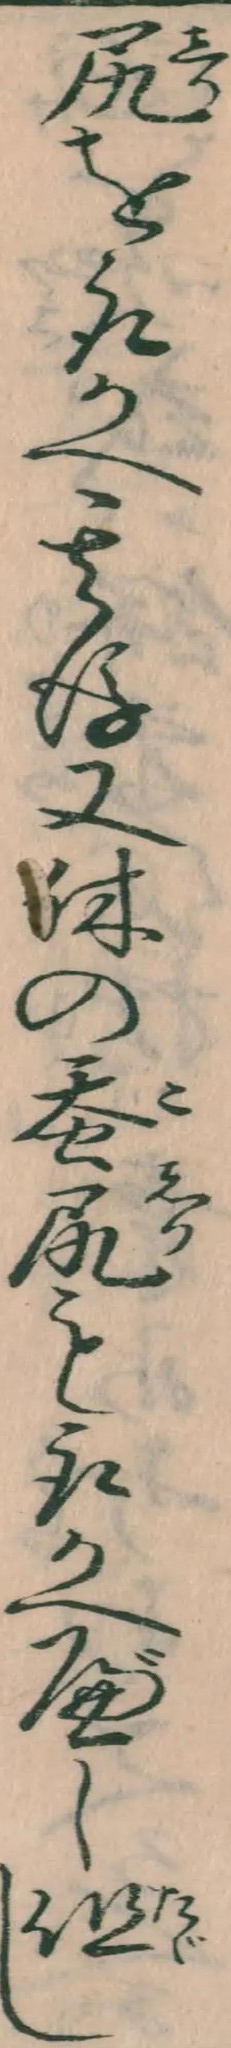尻を取かへ其後又休の蚕尻も取かへべし但し
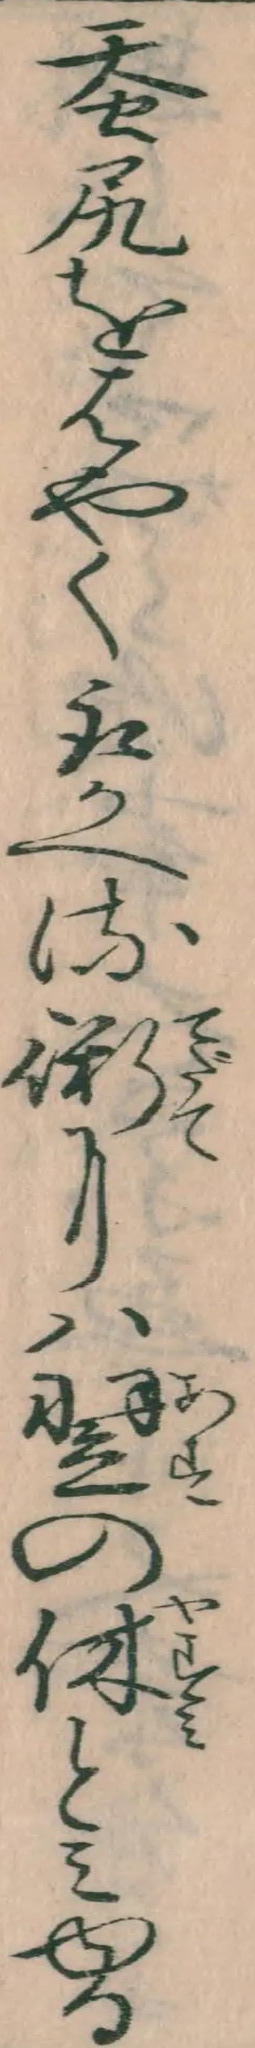蚕尻をはやく取かへる術には翌の休とみゆる
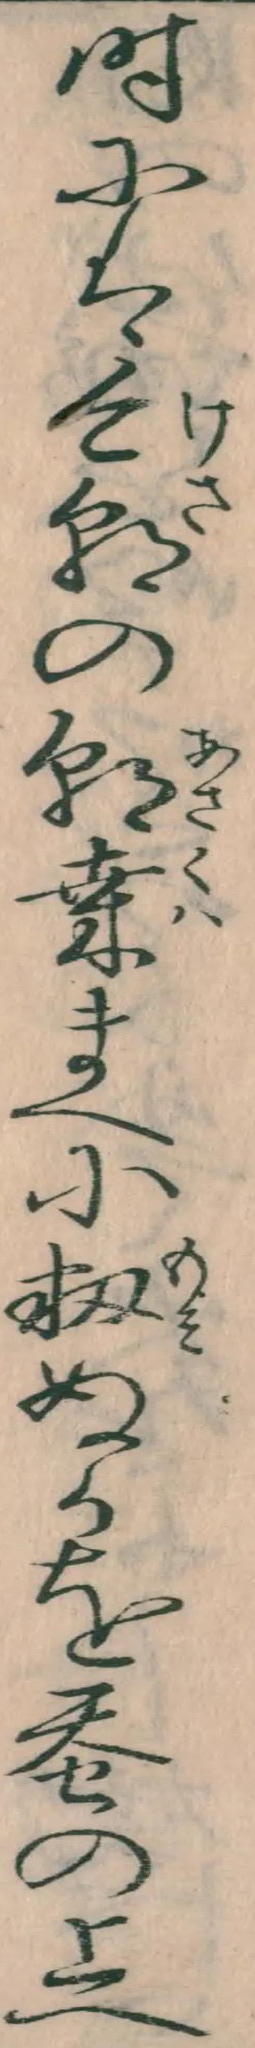時には今朝の朝桑まへに籾ぬかを蚕の上へ
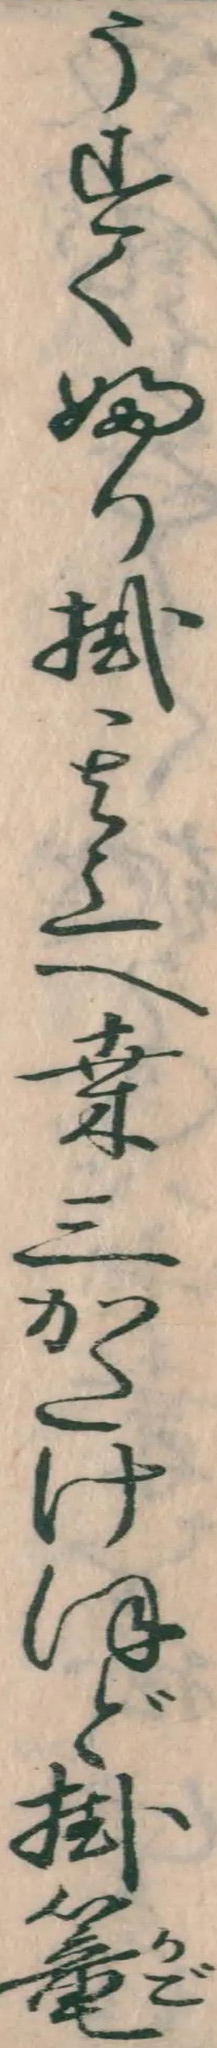うすくふり掛其上へ桑三かたけほど掛篭
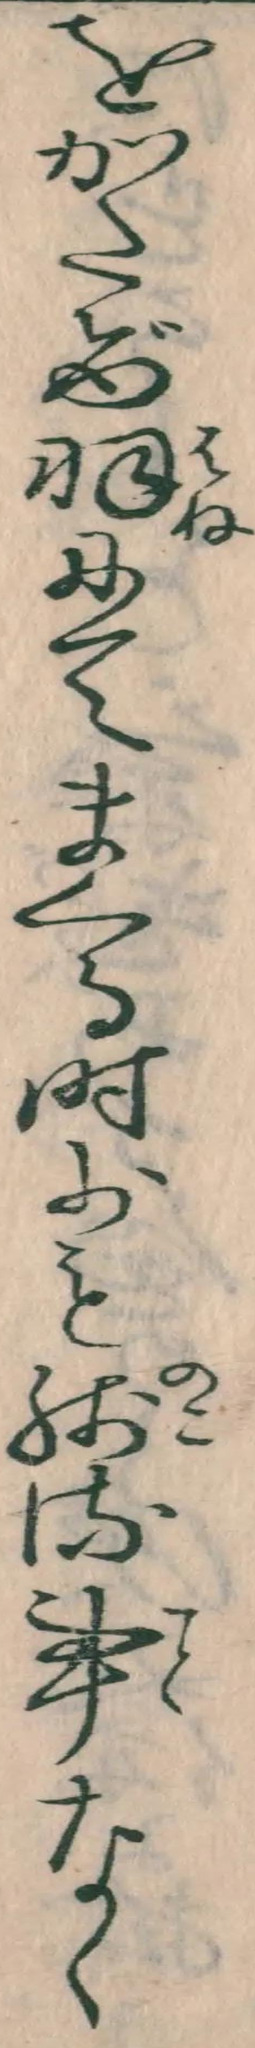をかたげ羽にてまくる時少も残る事なく
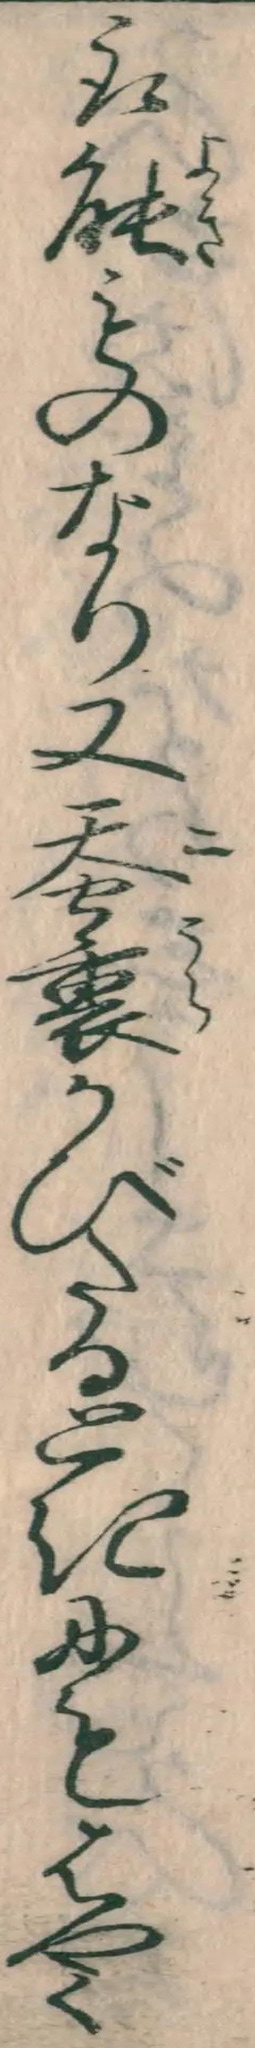取能ものなり又蚕裏かびたるときにもはやく
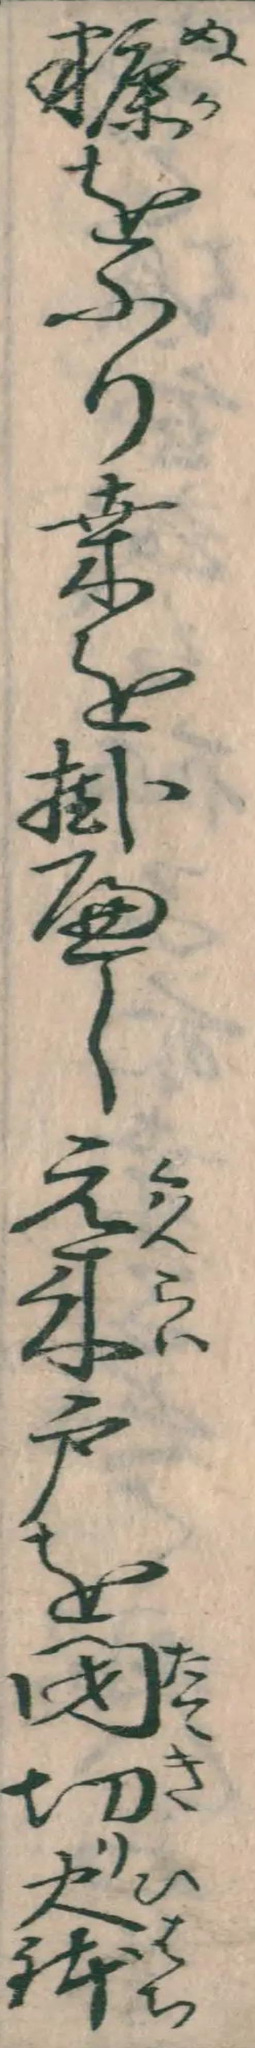糠をふり桑を掛へし元来戸を閉切り火鉢
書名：新撰養蚕秘書
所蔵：国立国会図書館 National Diet Library, JAPAN
